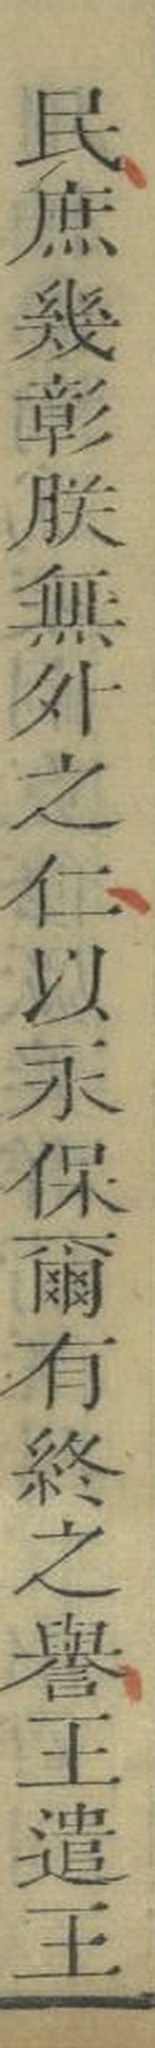民庶幾彰朕無外之仁以永保爾有終之誉王遣王
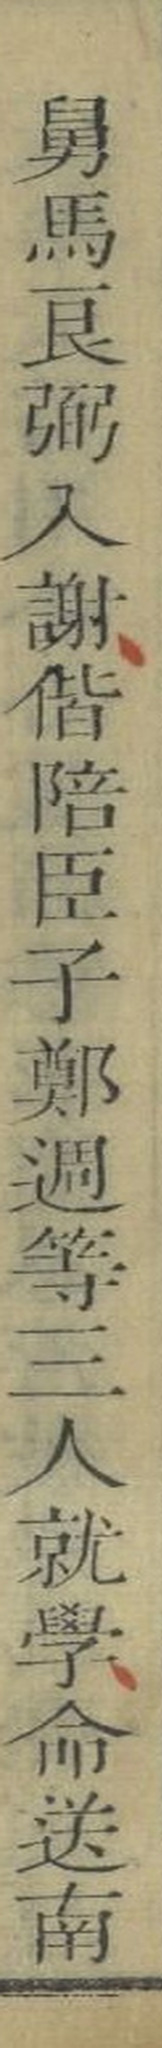舅馬良弼入謝偕陪臣子鄭週等三人就学命送南
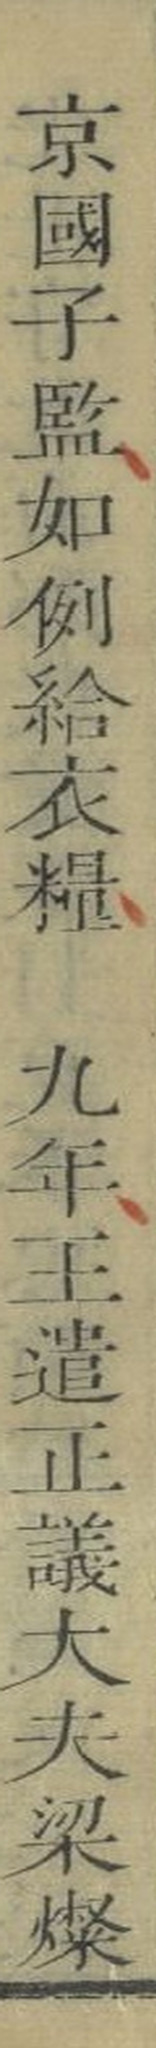京国子監如例給衣糧九年王遣正議大夫梁燦
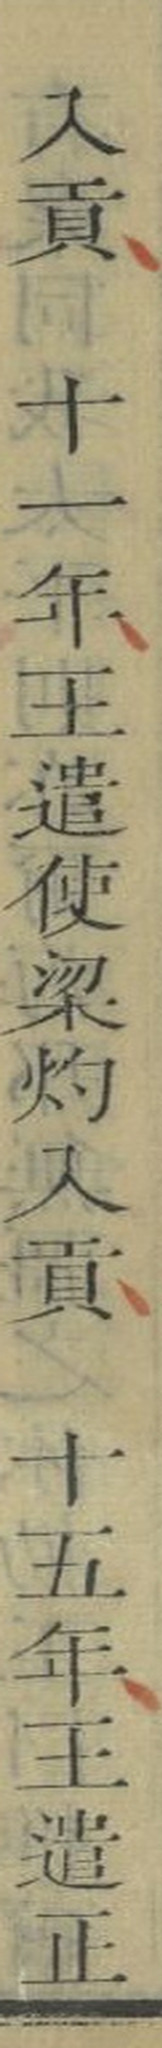入貢十一年王遣使梁灼入貢十五年王遣正
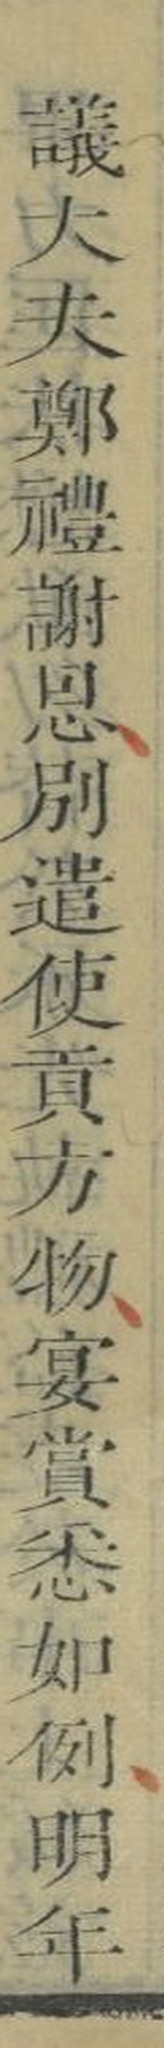議大夫鄭礼謝恩別遣使貢方物宴賞悉如例明年
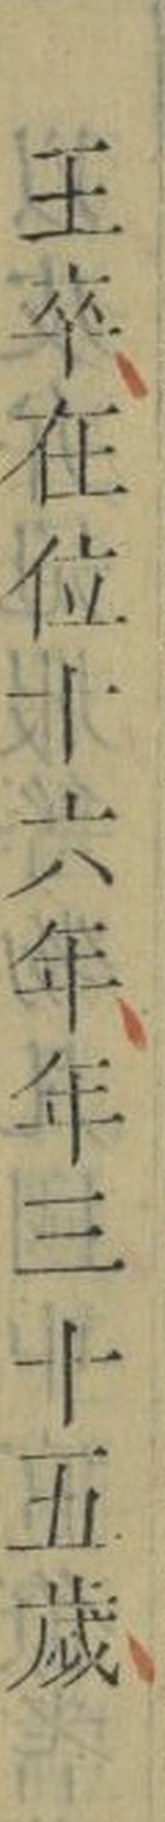王卒在位十六年年三十五歳
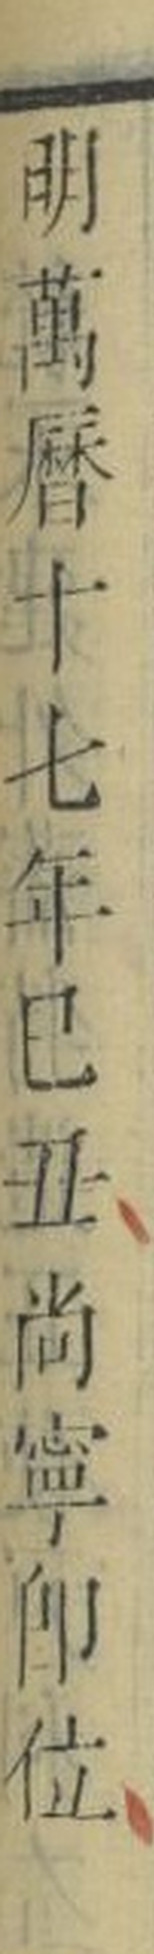明万暦十七年巳丑尚寧即位
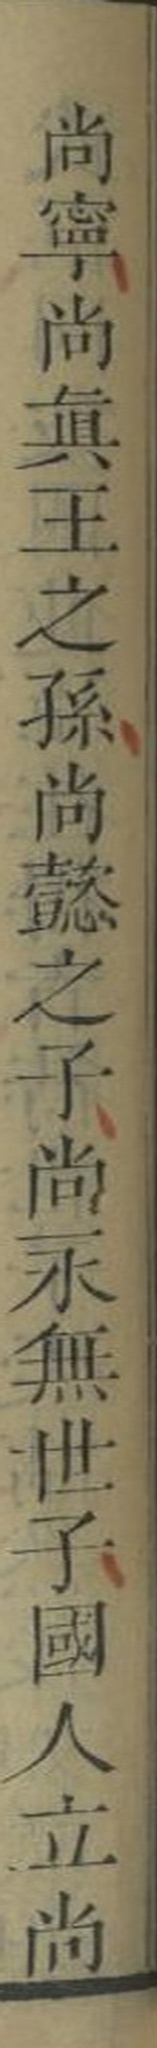尚寧尚真王之孫尚懿之子尚永無世子国人立尚
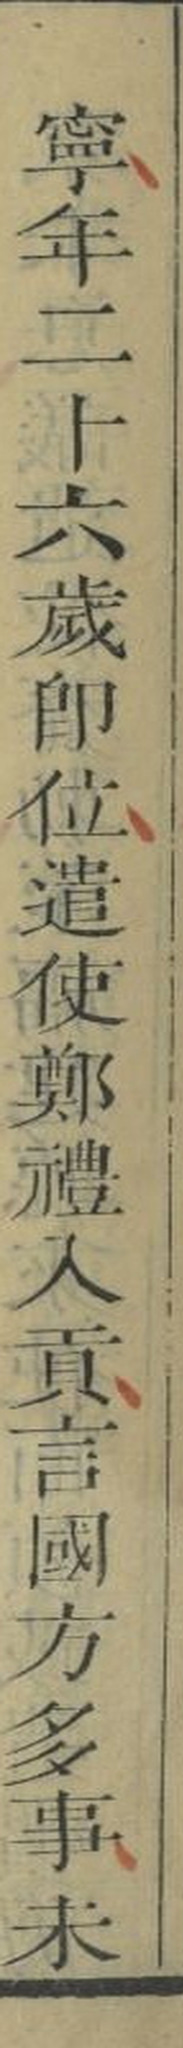寧年二十六歳即位遣使鄭礼入貢言国方多事未
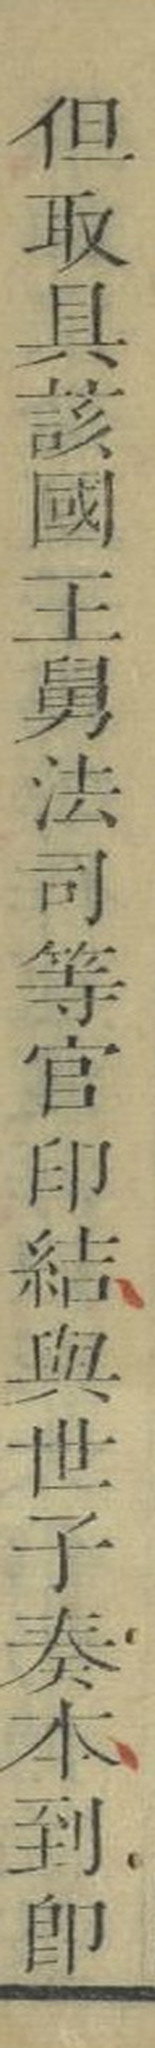但取具該国王舅法司等官印結与世子奏本到即
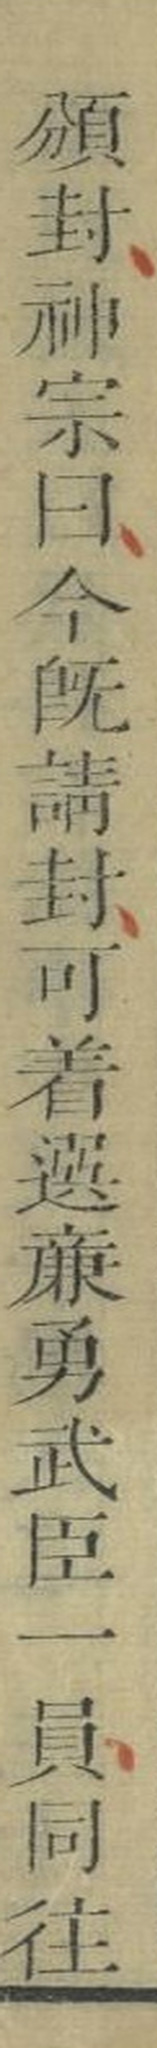頒封神宗曰今既請封可着選廉勇武臣一員同往
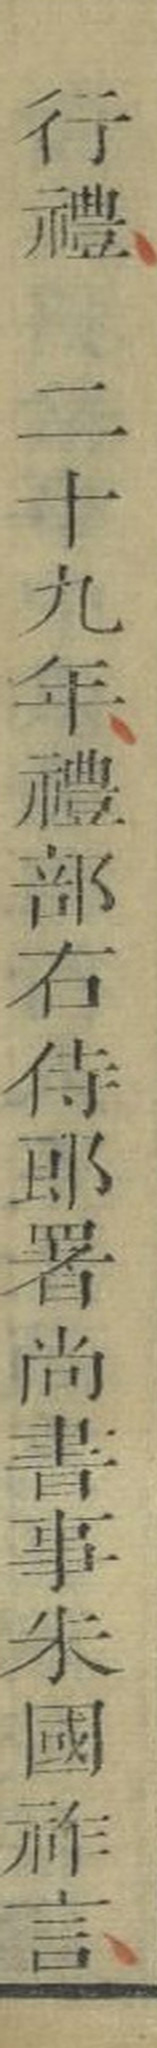行礼二十九年礼部右侍郎署尚書事朱国祚言
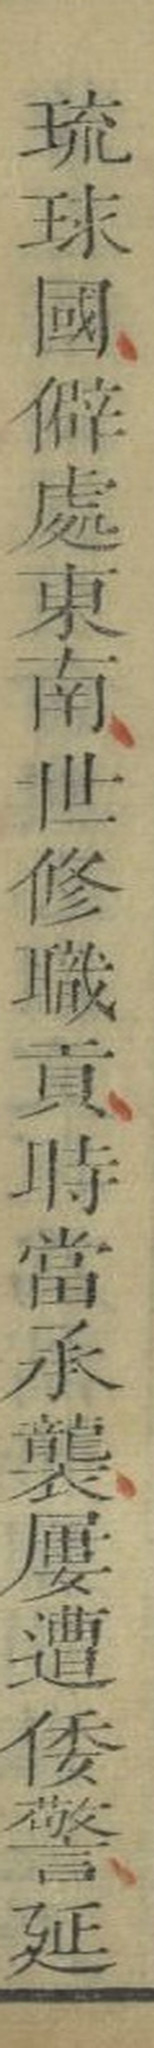琉球国僻処東南世修職貢時当承襲屢遭倭警延
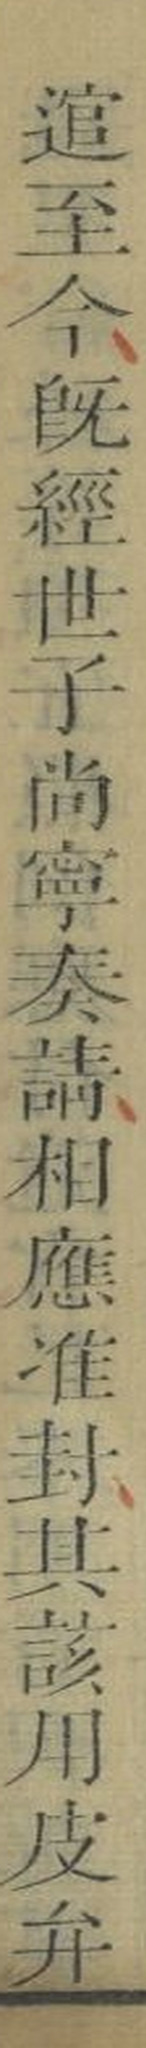逭至今既経世子尚寧奏請相応准封其該用皮弁

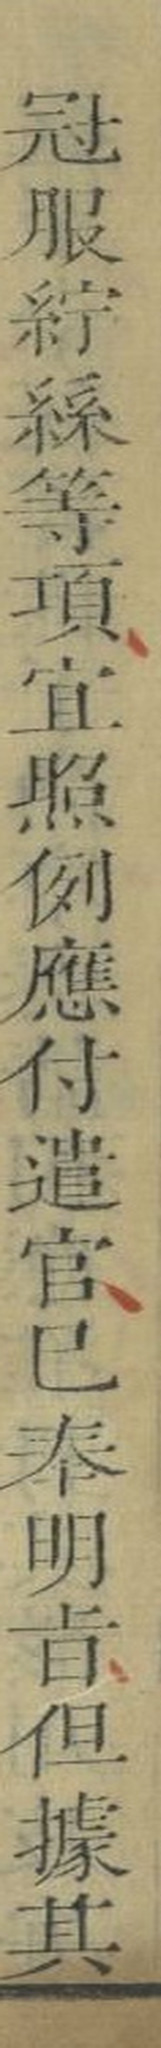冠服紵糸等項宜照例応付遣官巳奉明旨但拠其
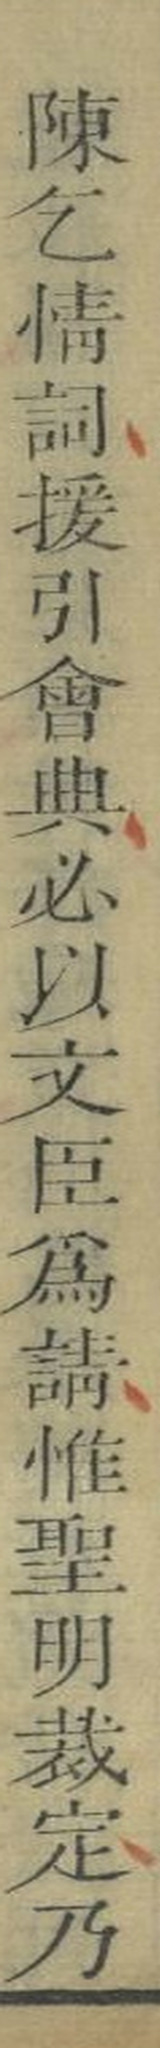陳乞情詞援引会典必以文臣為請惟聖明裁定乃
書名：中山伝信録 巻三
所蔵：University of the Ryukyus Library
